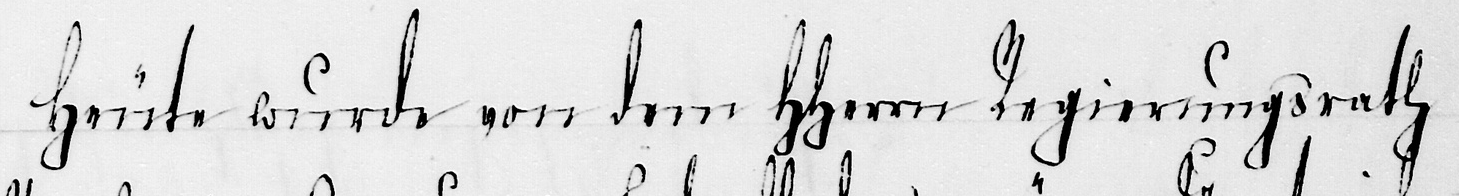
Heute wurde von dem HHerrn Regierungsrath
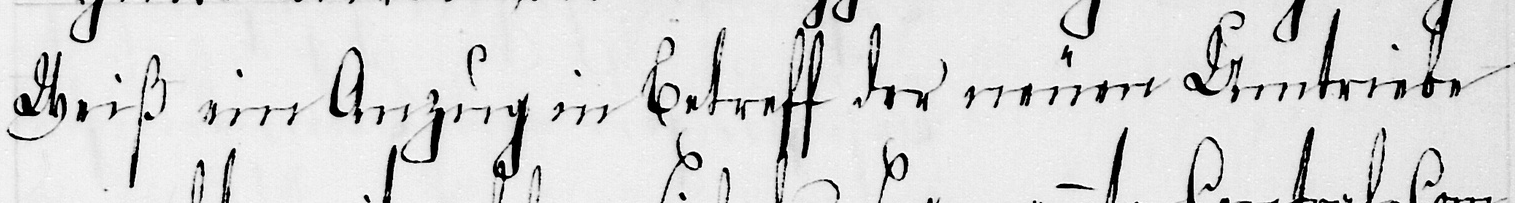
Weiß ein Auszug in Betreff der neuen Umtriebe
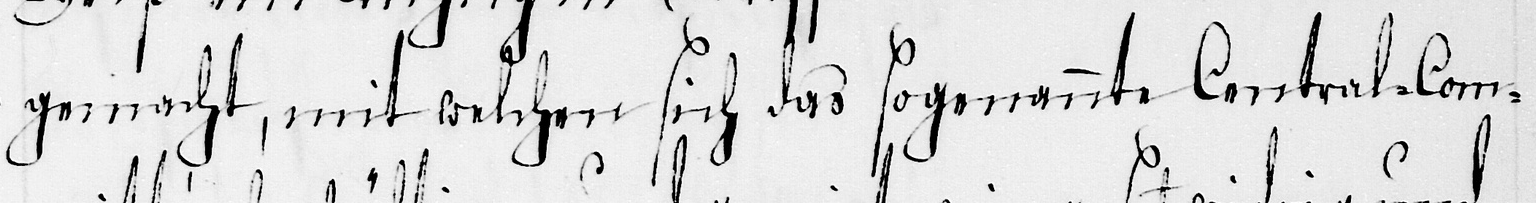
gemacht, mit welchen sich das sogenannte Central-Com¬
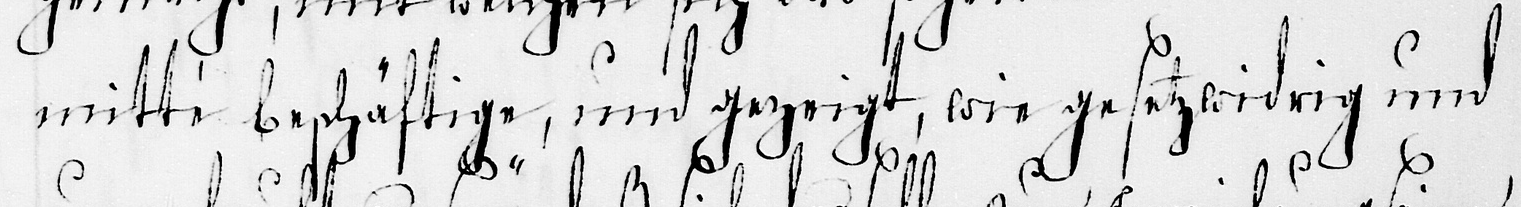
mitté beschäftige, und gezeigt, wie gesetzwidrig und
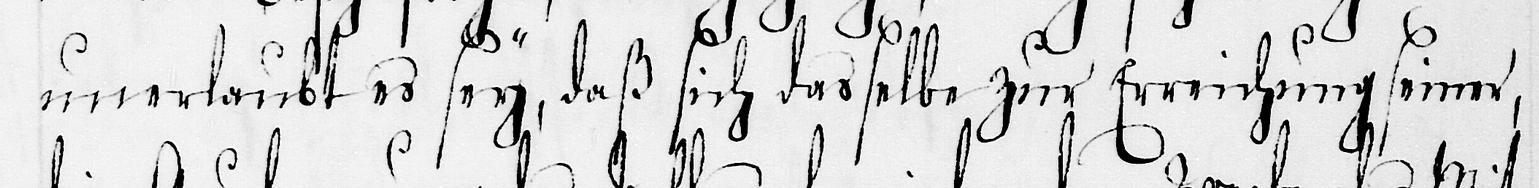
unerlaubt es sey, daß sich dasselbe zur Erreichung seiner,
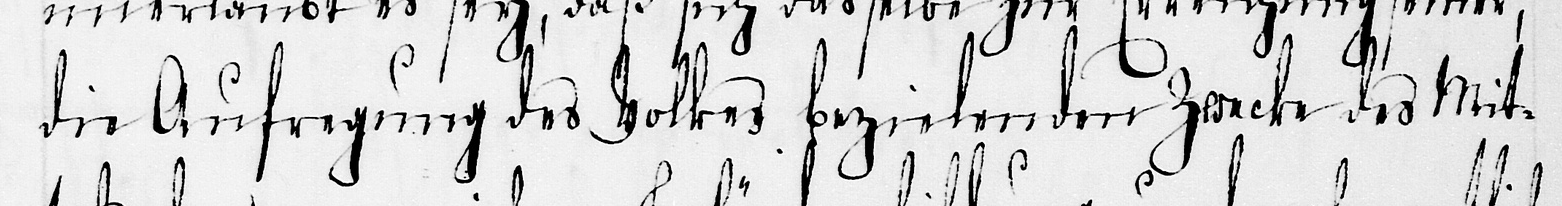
die Aufregung des Volkes bezielenden Zwecke des Mit¬
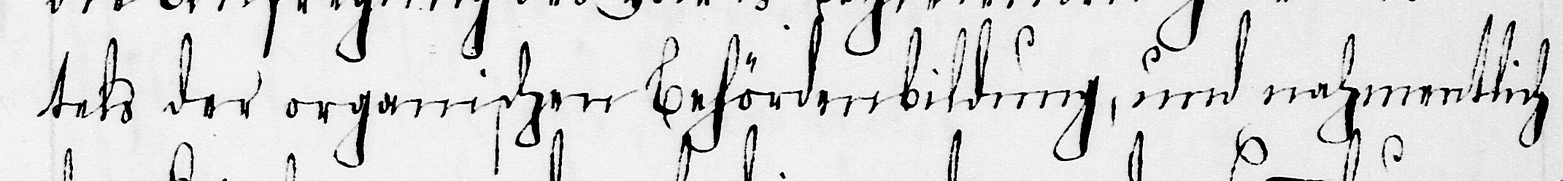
tels der organischen Behördenbildung, und nahmentlich
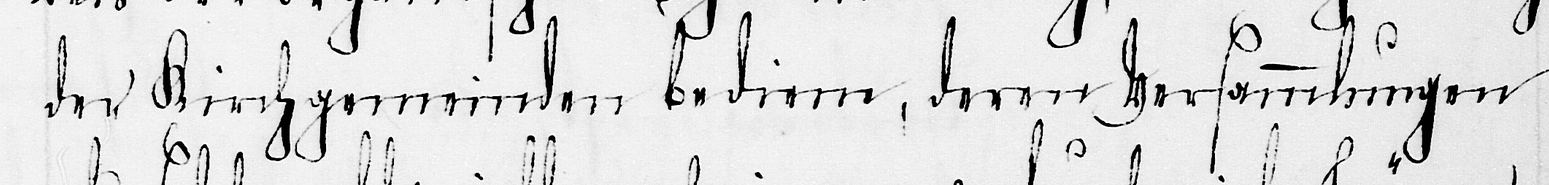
der Kirchgemeinden bediene, deren Versammlungen
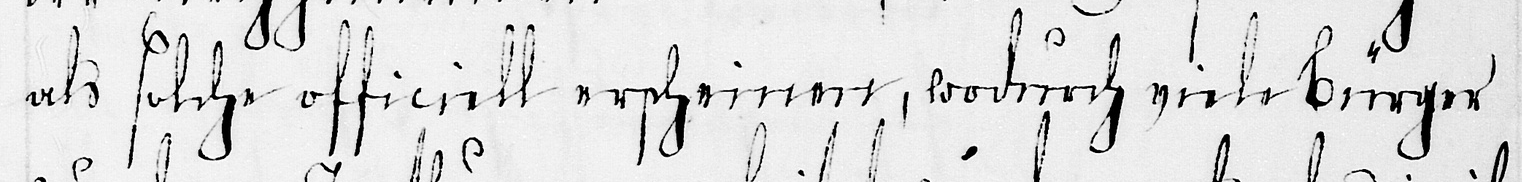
als solche officiell erscheinen, wodurch viele Bürger
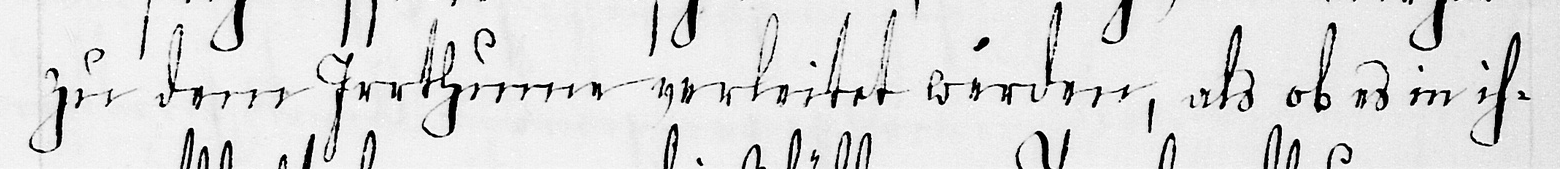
zu dem Irrthume verleitet werden, als ob es in ih¬
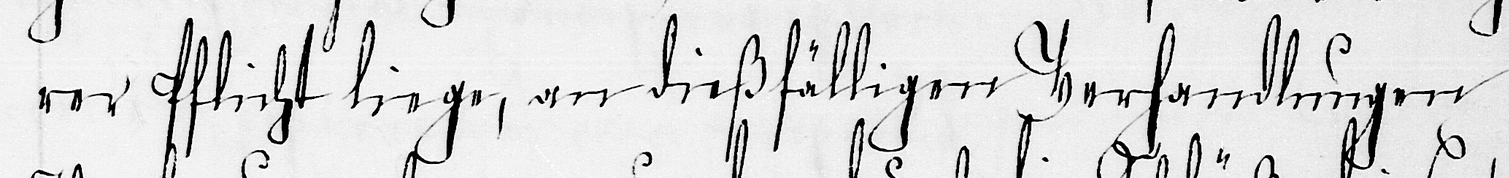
rer Pflicht liege, an dießfälligen Verhandlungen
